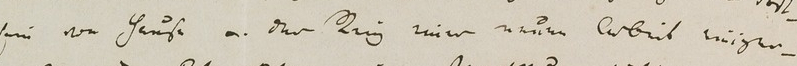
sein vom Hause &. der Reiz einer neuen Arbeit einiger-
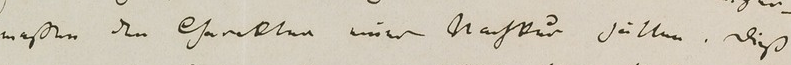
maßen den Charakter einer Nachkur hätten. Dieß
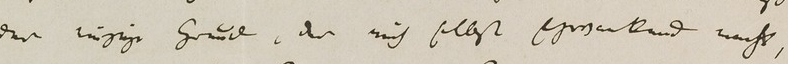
der einzige Grund, der mich selbst schwankend macht,
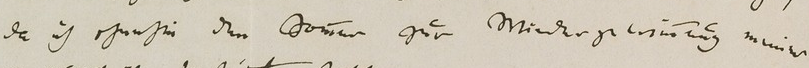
da ich ohnehin den Sommer zur Wiedergewinnung meiner
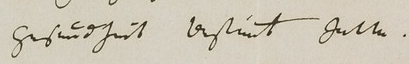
Gesundheit bestimmt hatte.
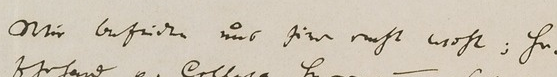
Wir befinden uns hier recht wohl; Hr.
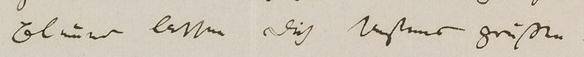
Blumer lassen Dich bestens grüßen.
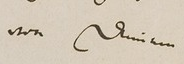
von Deinem
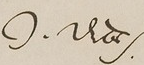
J. Dubs.
